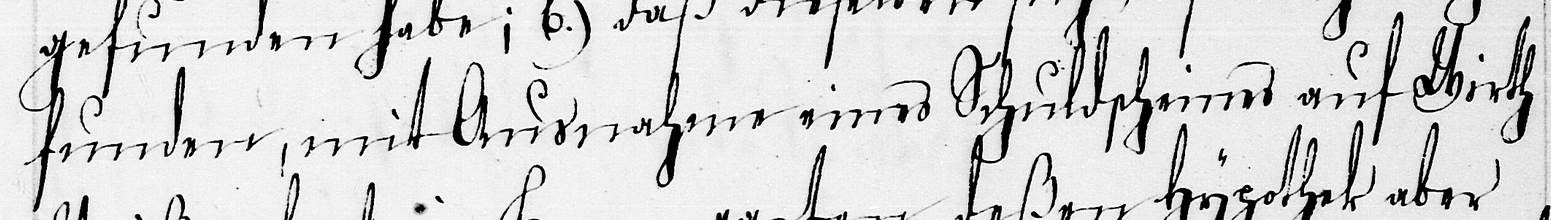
funden, mit Ausnahme eines Schuldscheines auf Wirth
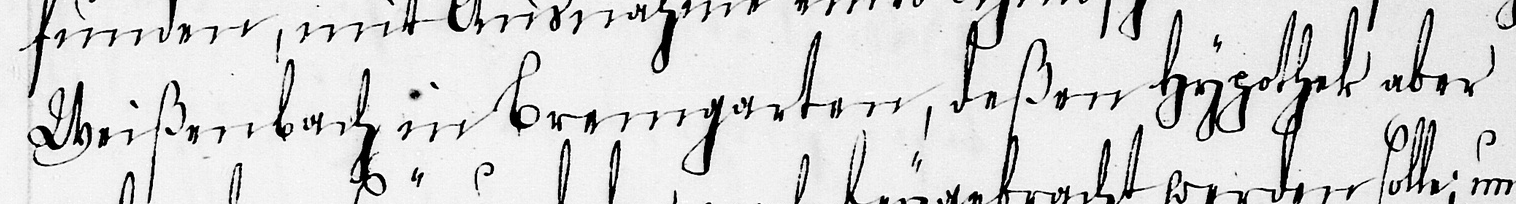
Weißenbach in Bremgarten, deßen Hypothek aber
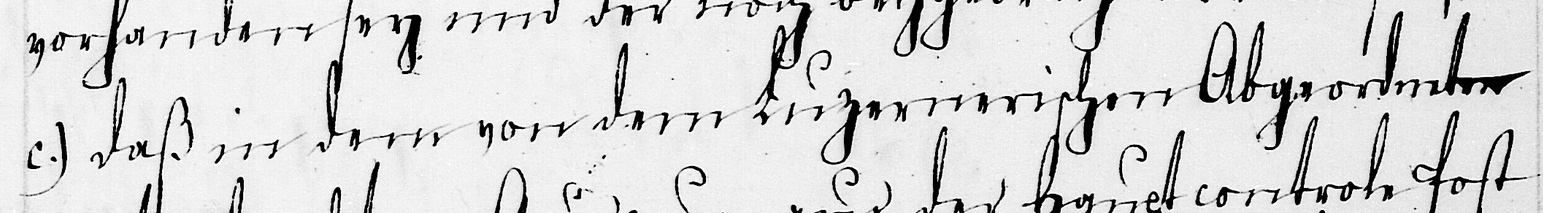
c.) daß in dem von dem Luzernerischen Abgeordneten
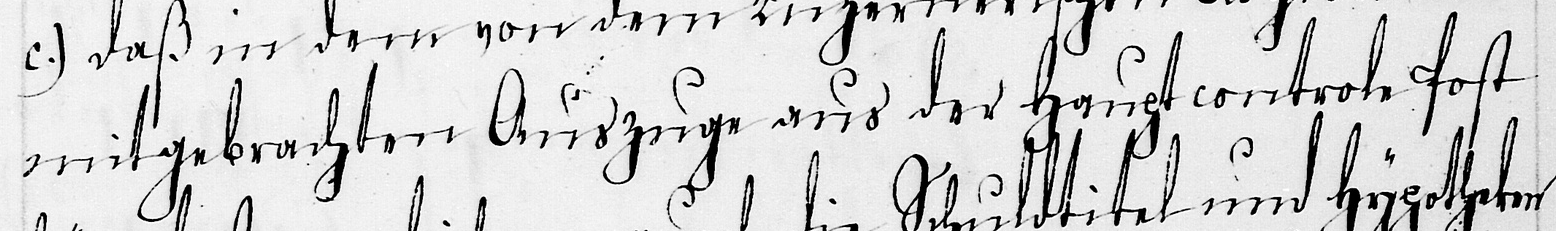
mitgebrachten Auszuge aus der Hauptcontrole Post
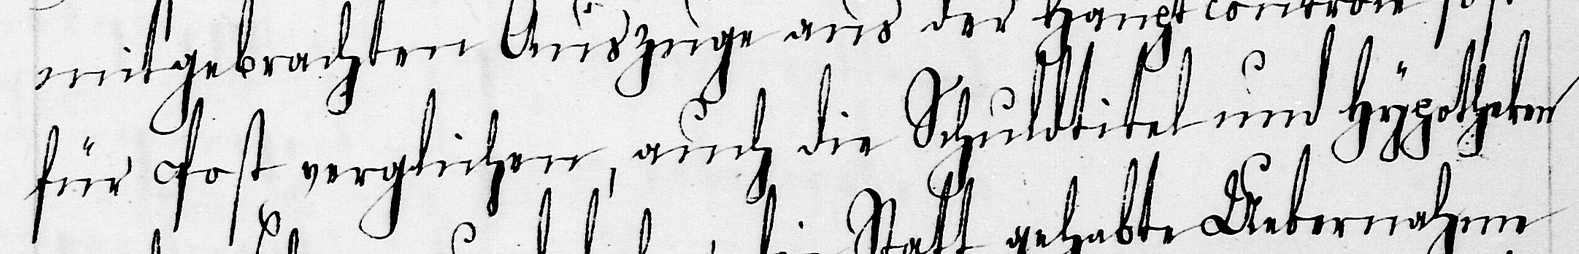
für Post verglichen, auch die Schuldtitel und Hypotheken
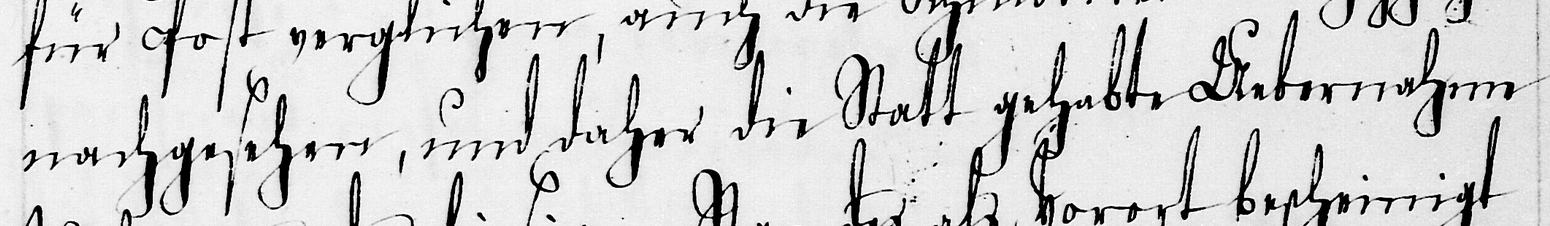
nachgesehen, und daher die Statt gehabte Uebernahme
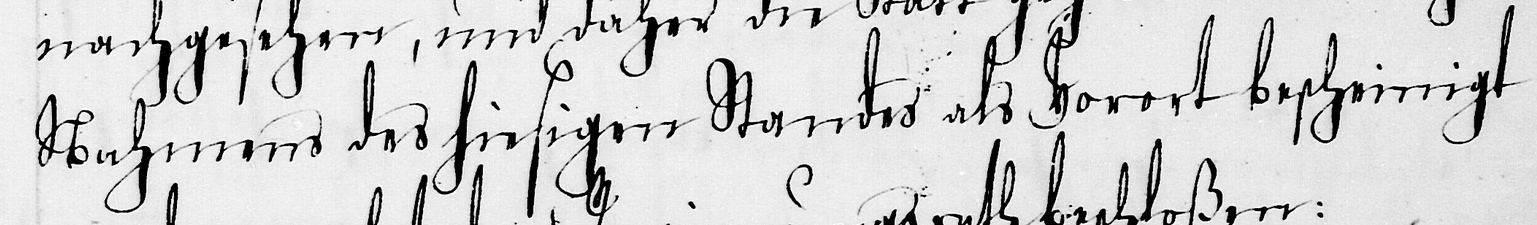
Nahmens des hiesigen Standes als Vorort bescheinigt
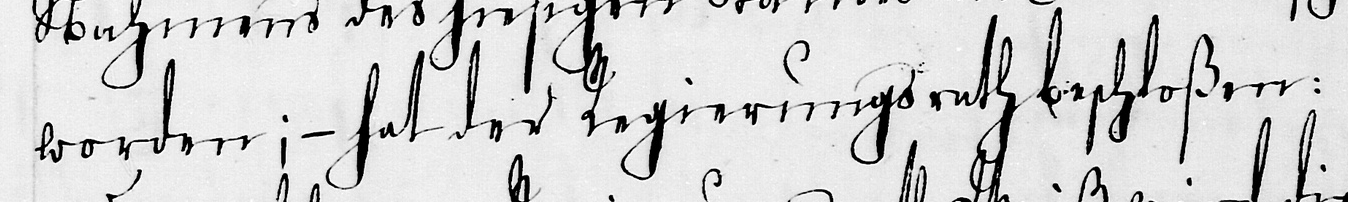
worden; – hat der Regierungsrath beschloßen:
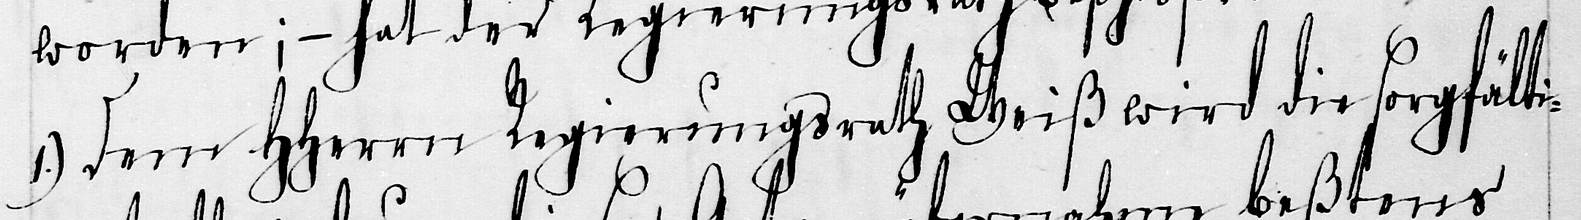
1.) Dem HHerrn Regierungsrath Weiß wird die sorgfälti¬
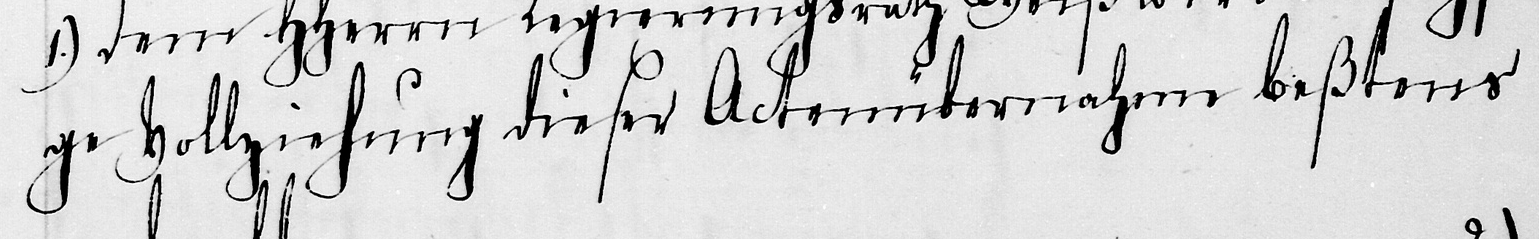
ge Vollziehung dieser Actenübernahme beßtens
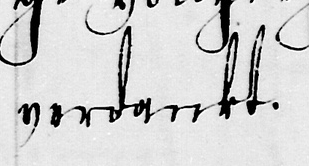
verdankt.
